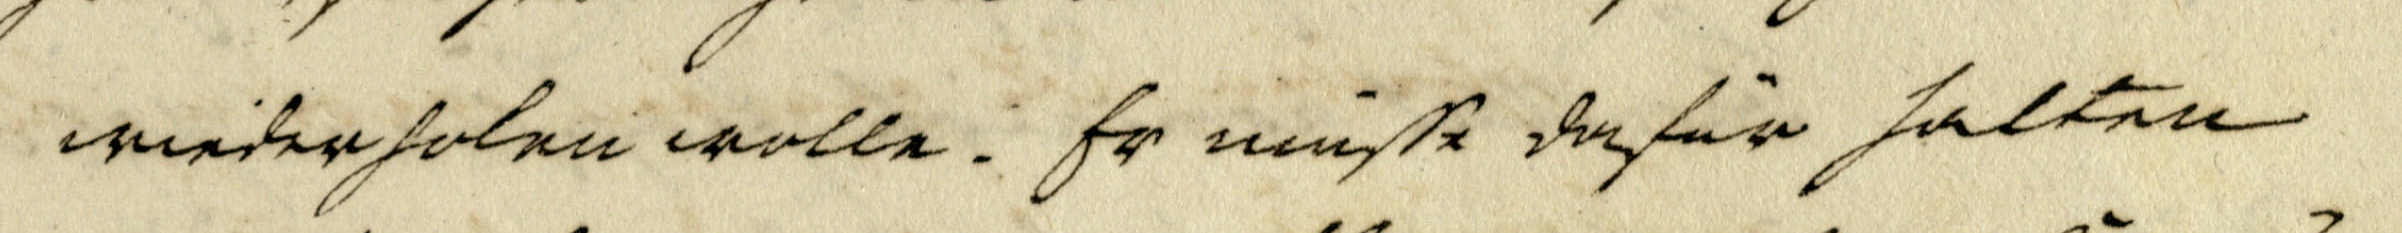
wiederholen wolle. Er müsse dafür halten,
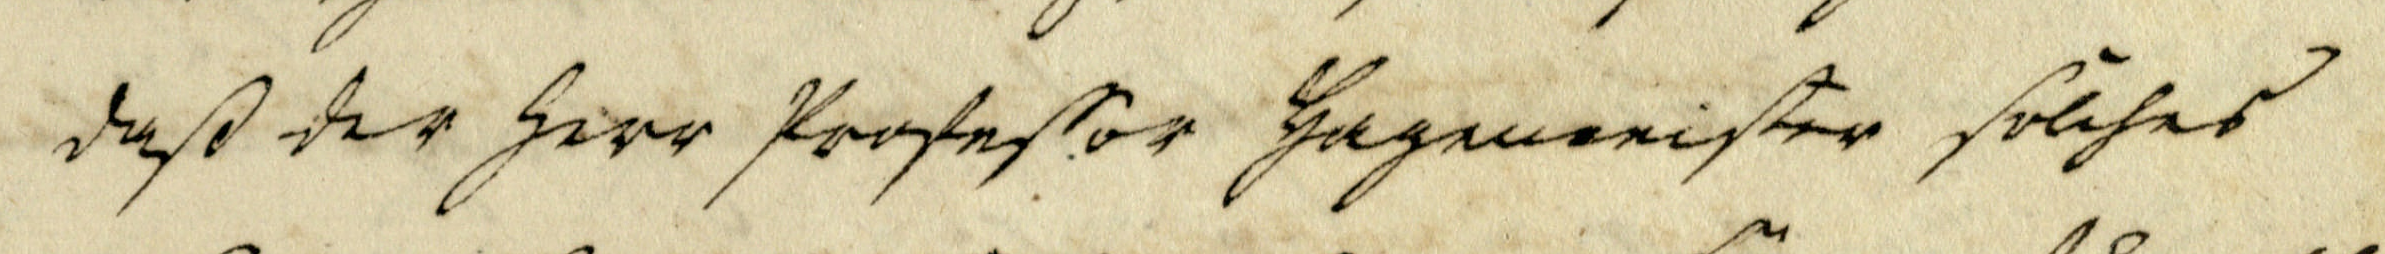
daß der Herr Professor Hagemeister solches
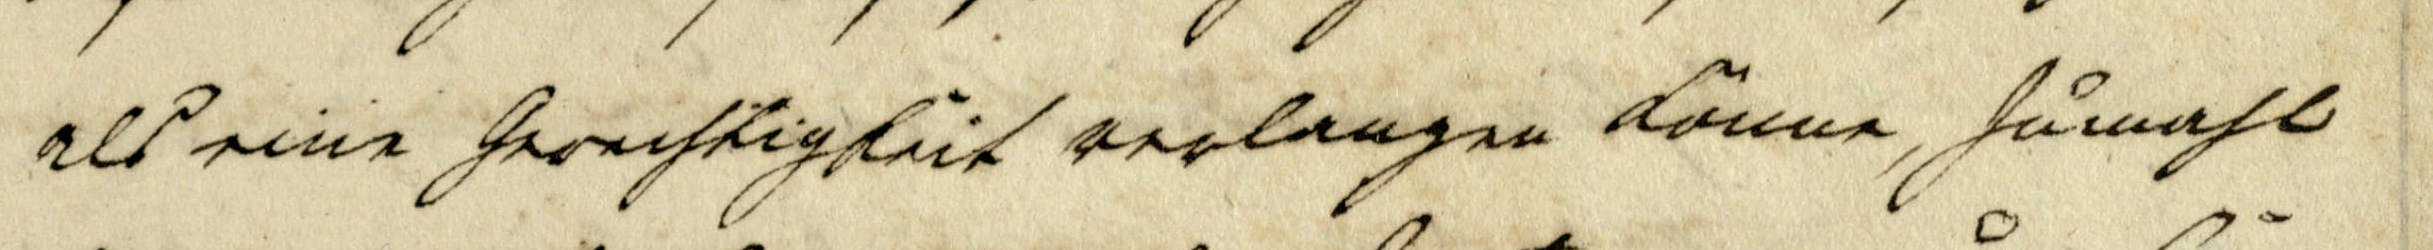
als eine Gerechtigkeit verlangen könne, zumahl
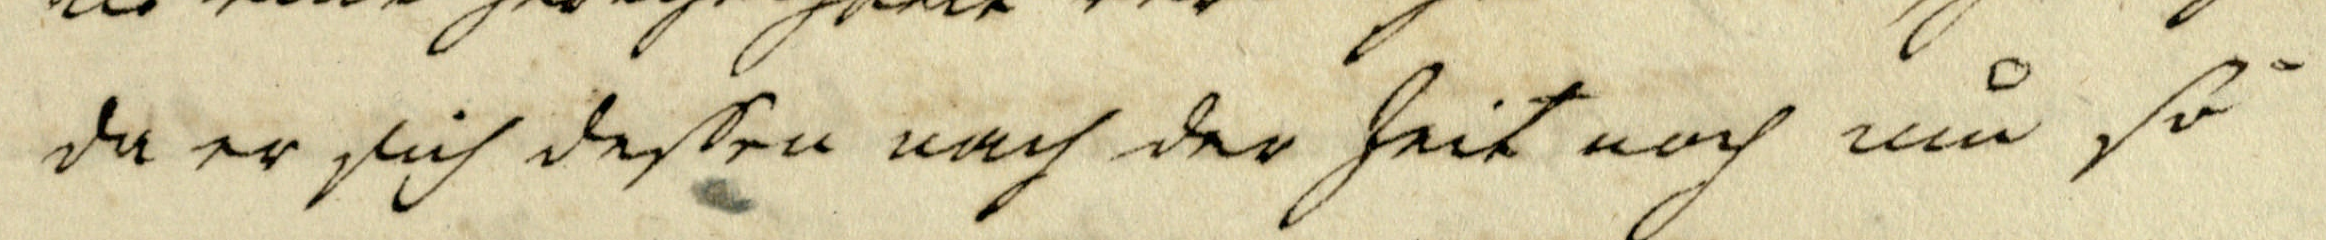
da er sich dessen nach der Zeit noch um so
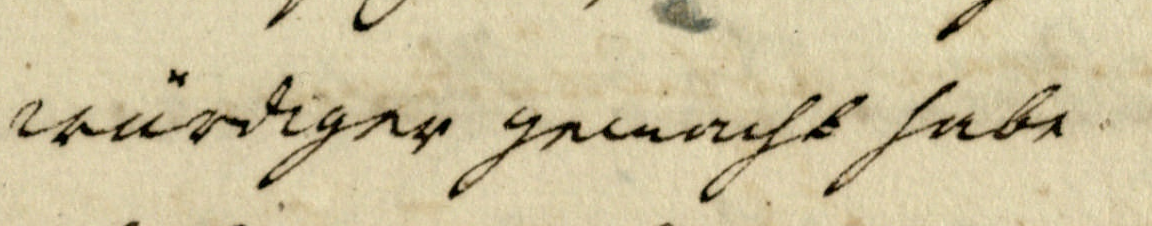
würdiger gemacht habe.
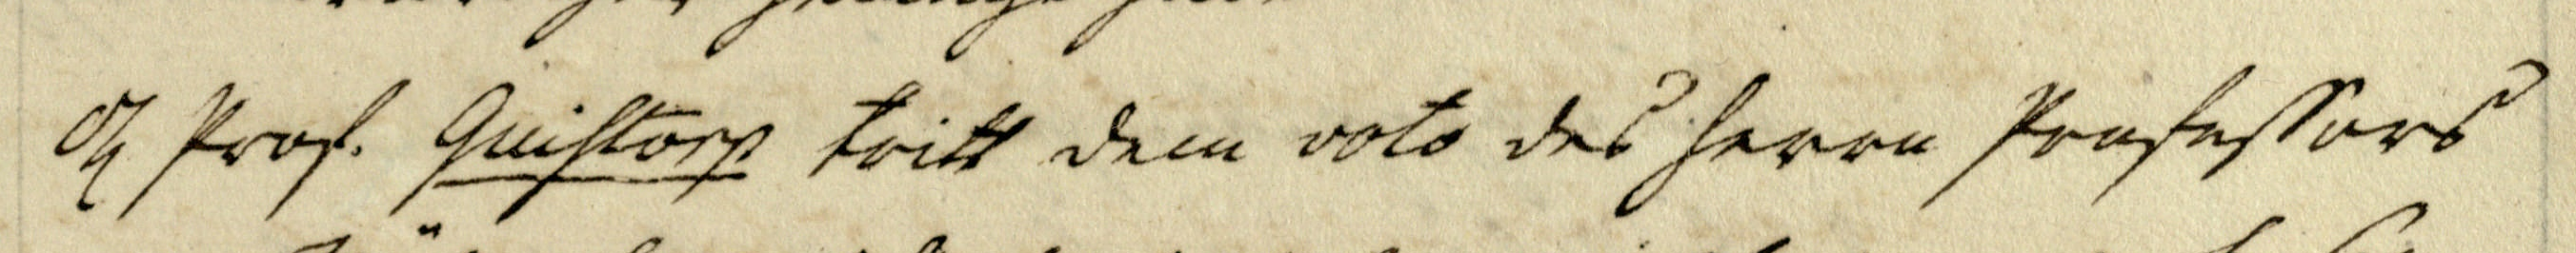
dh. Prof. Quistorp tritt dem voto des Herrn Professors
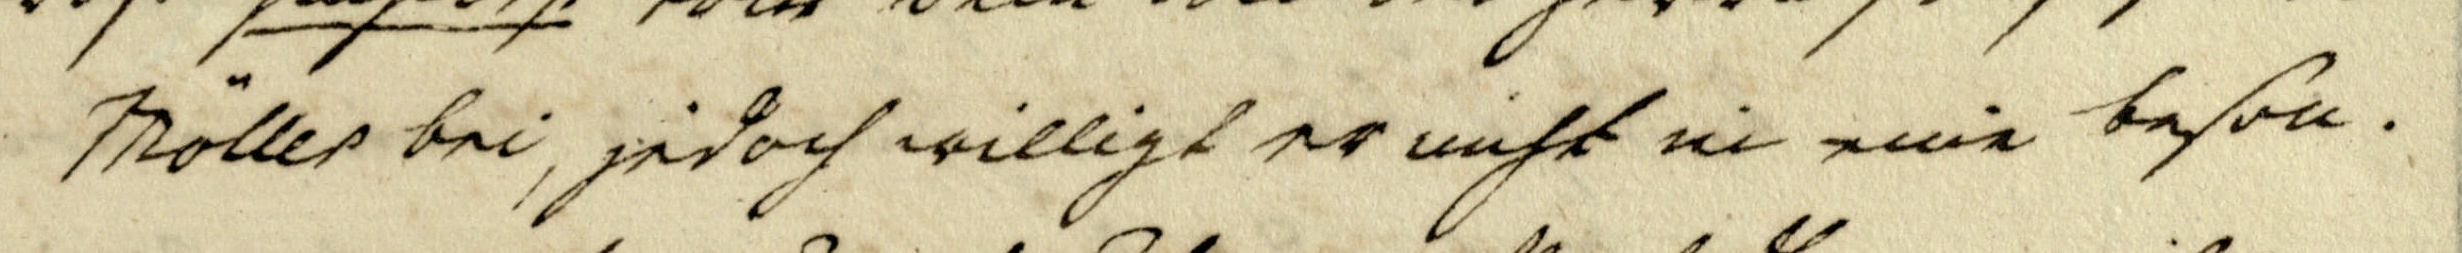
Möller bei, jedoch willigt er nicht in eine beson¬
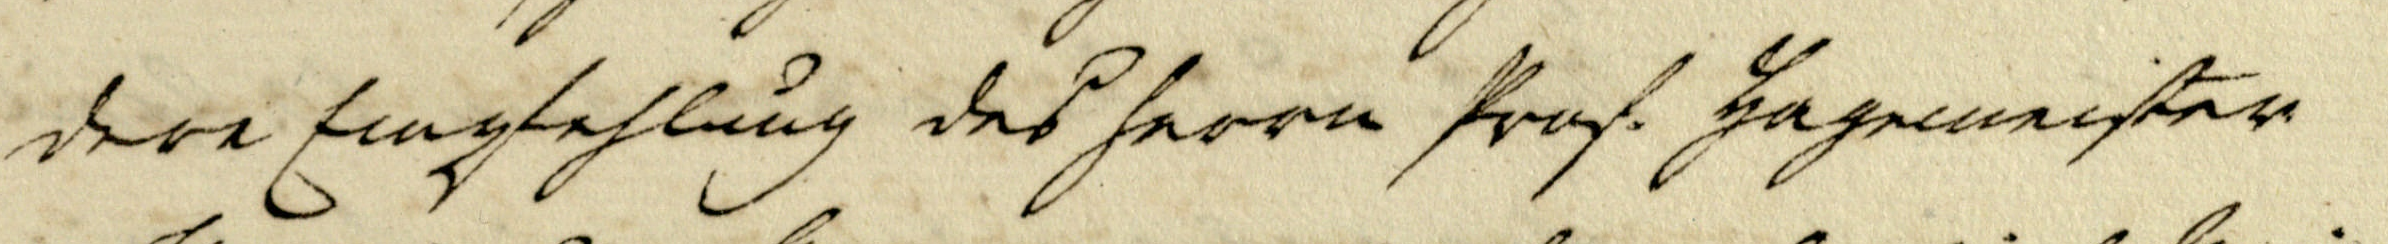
dere Empfehlung des Herrn Prof. Hagemeister
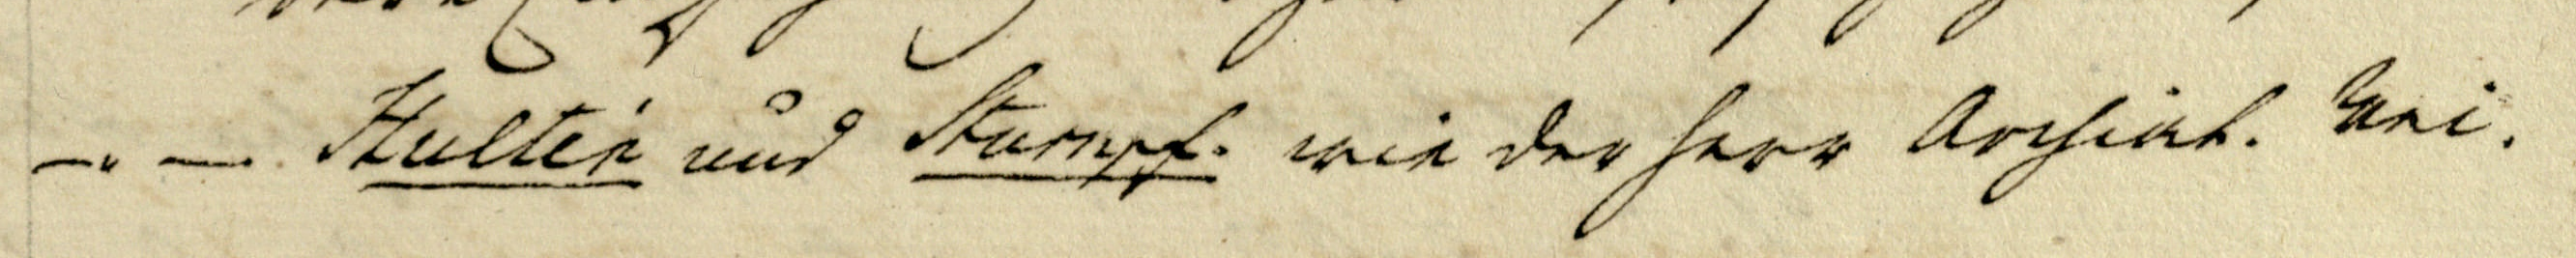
Hultén und Stumpf. wie der Herr Archiat. Wei¬
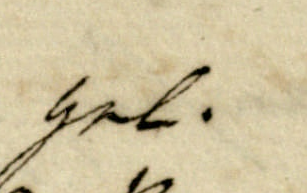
gel.
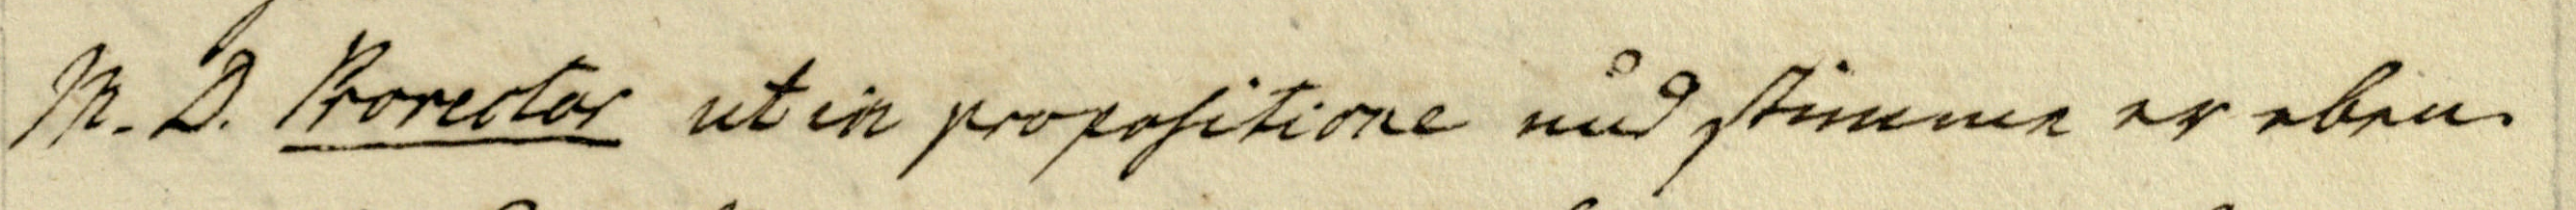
M. D. Prorector ut in propositione und stimme er eben¬
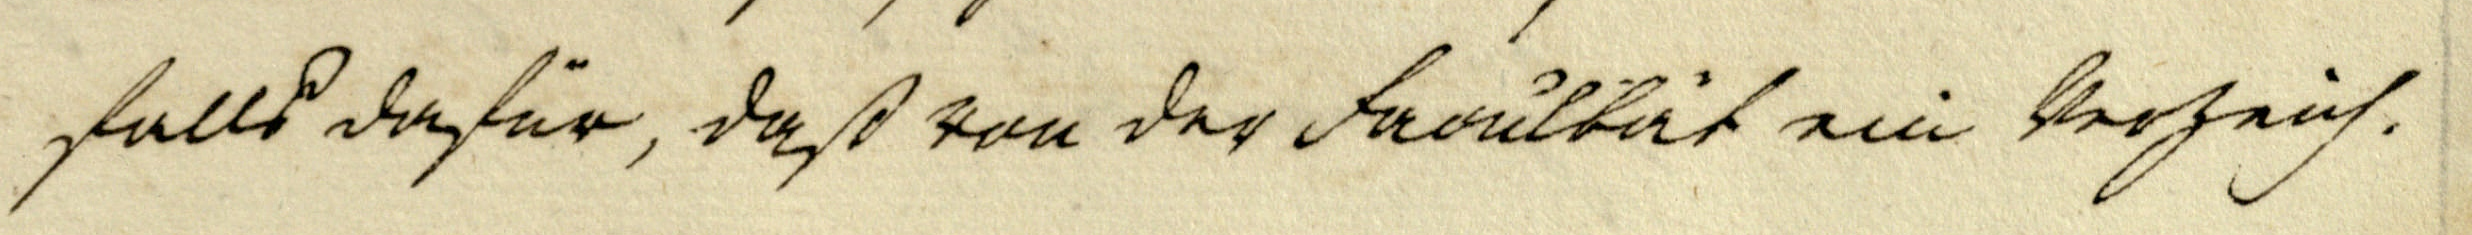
falls dafür, daß von der Facultät ein Verzeich¬
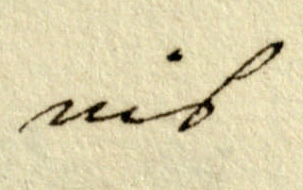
nis
